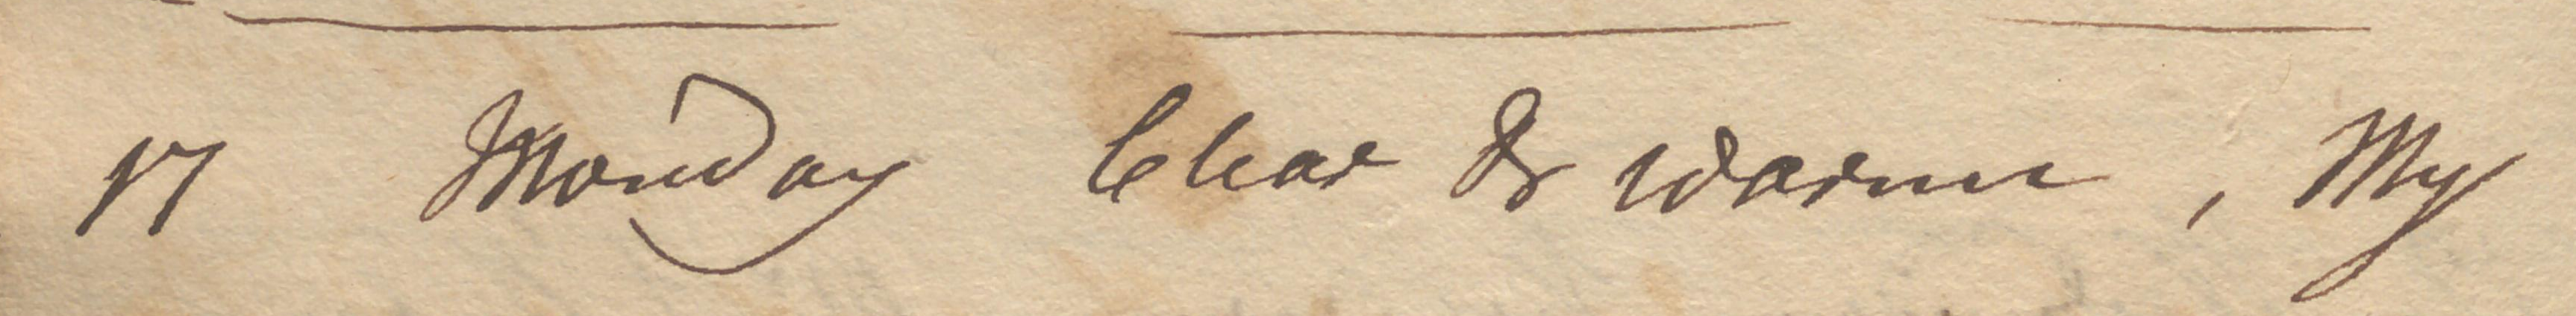17 Monday Clear & Warme, My
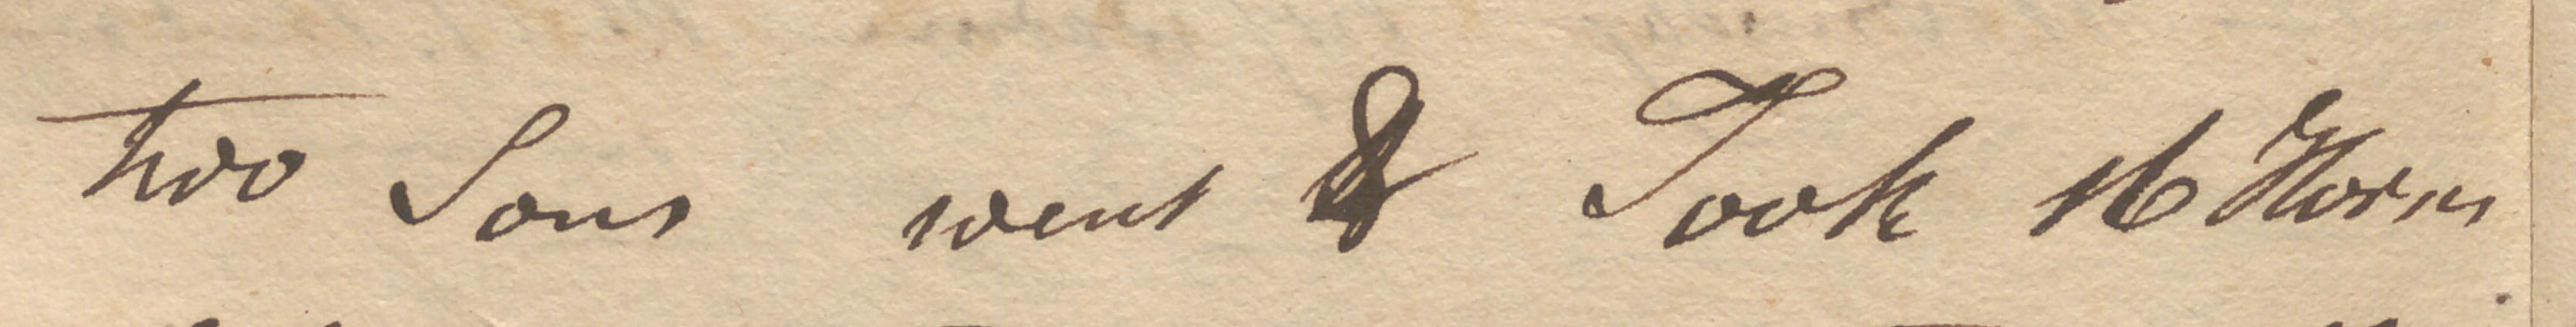two Sons went & Took 16 Horses
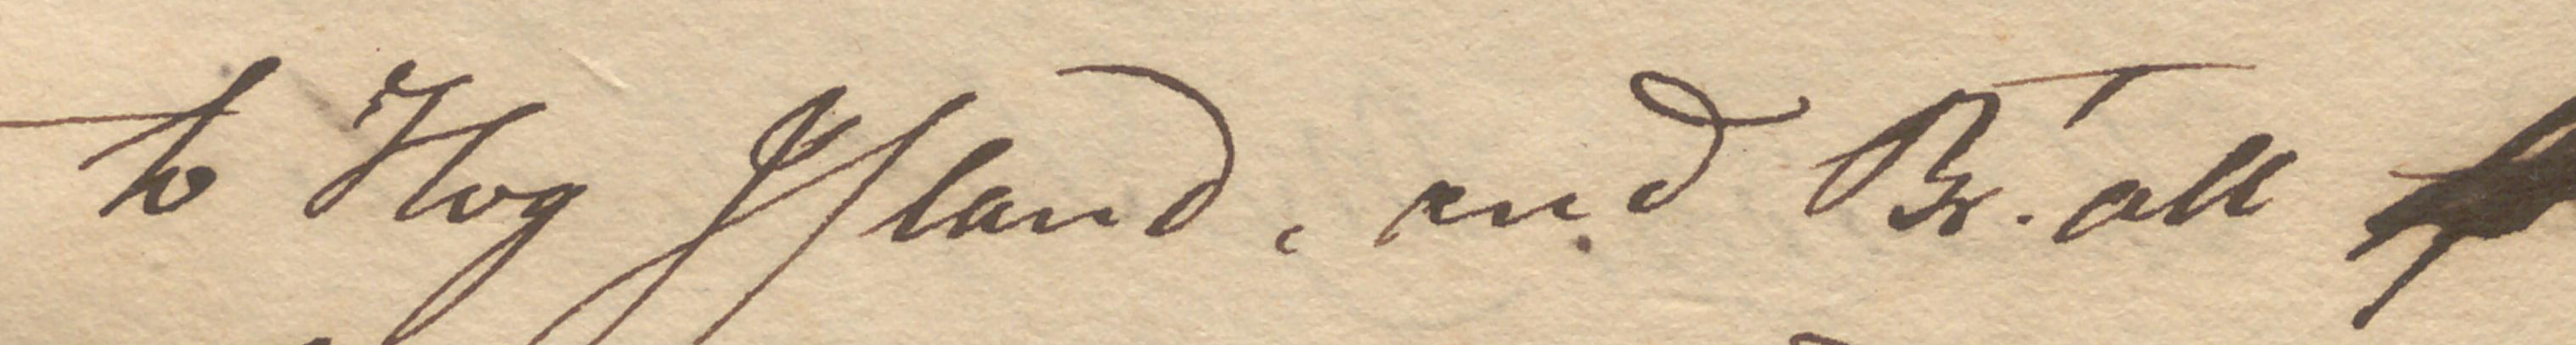to Hoy Island. and Br^t. all
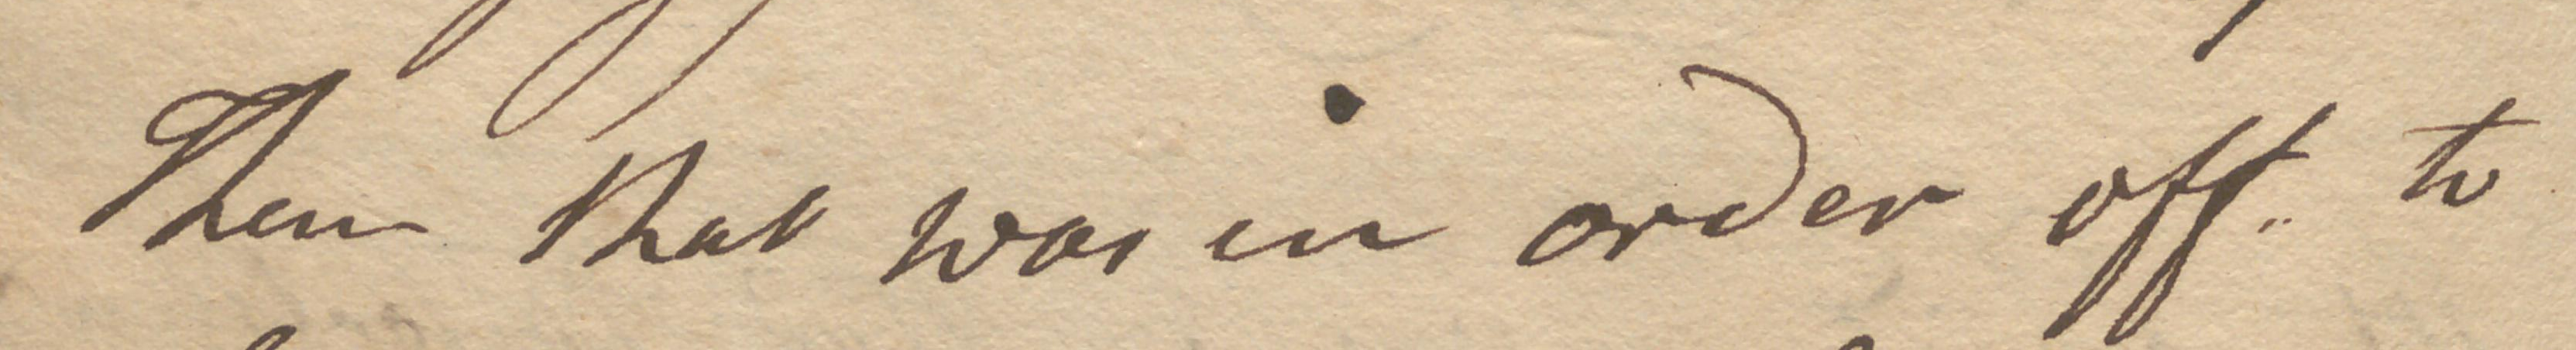Them that was in order off. to
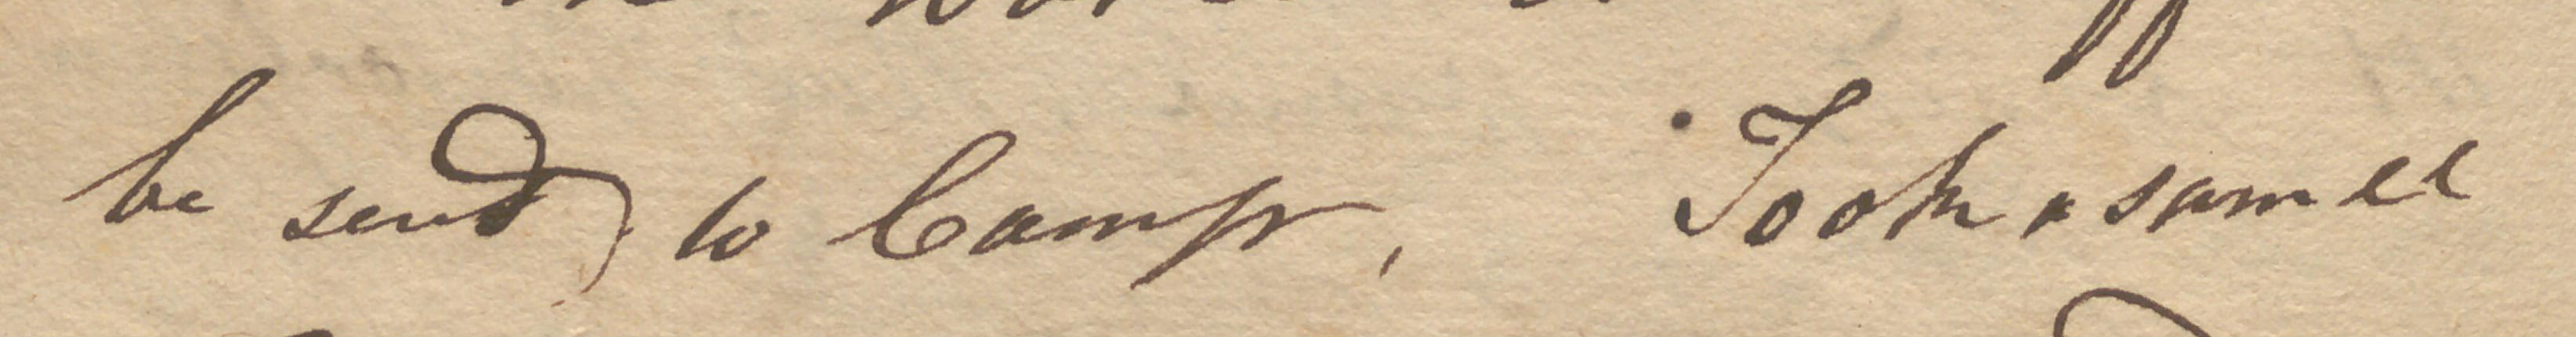be send to Camp, Took samll
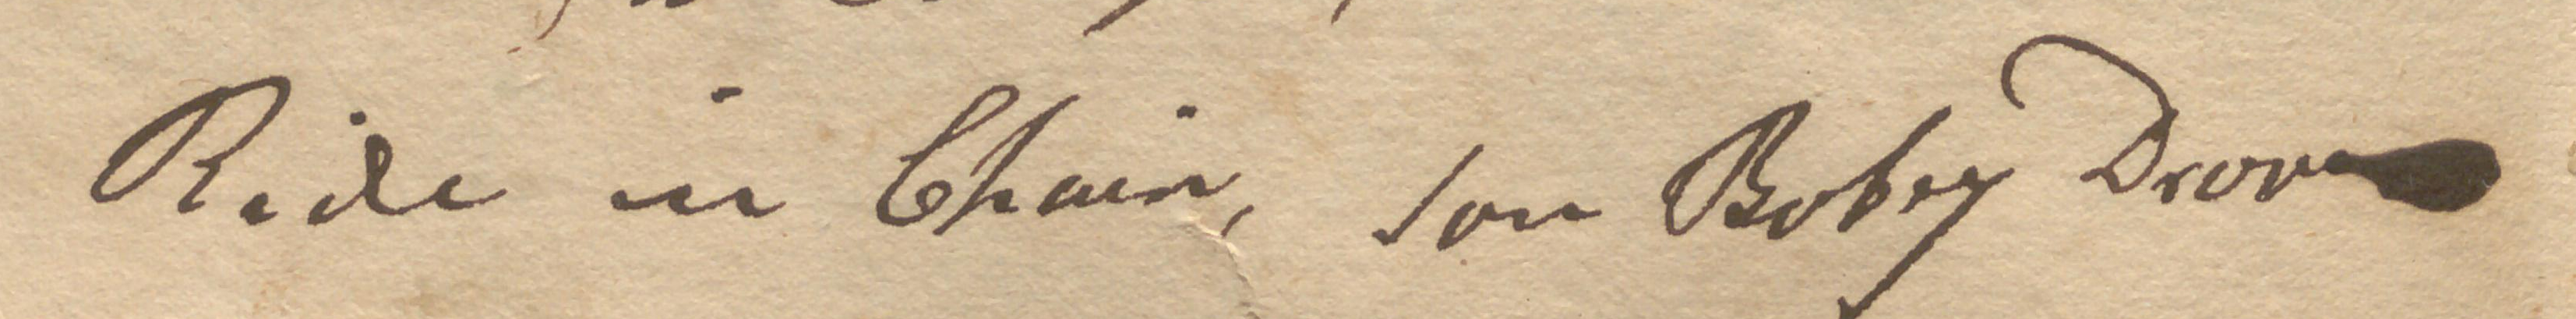Ride in Chair, son Bobey Drove
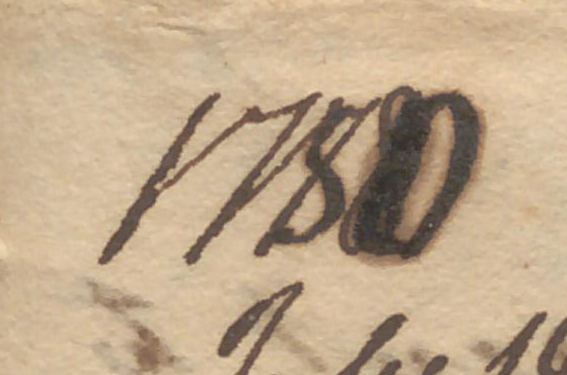1780
